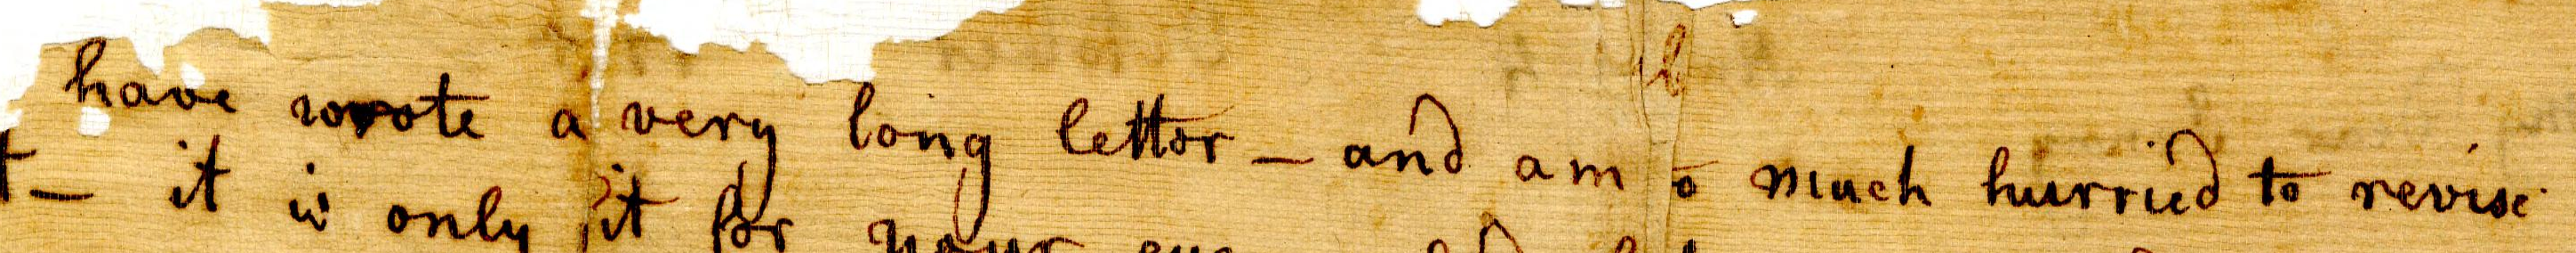have wrote a very long letter- and am [_]o much hurried to revise
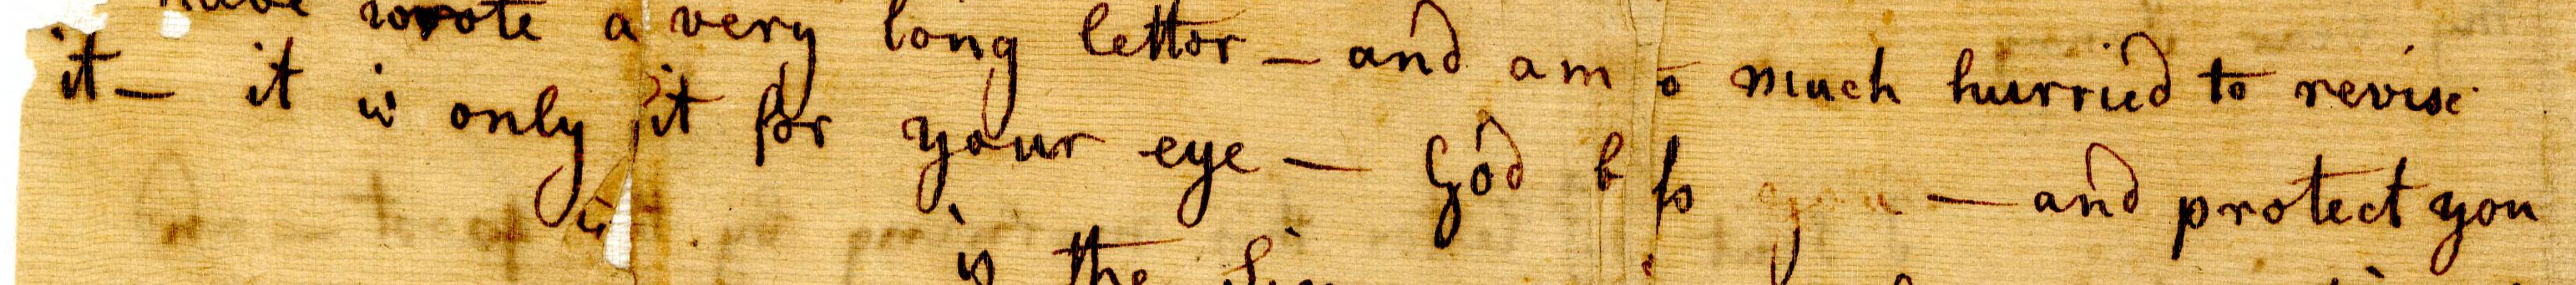it- it is only [_]it for your eye- God b[__]ess you- and protect you
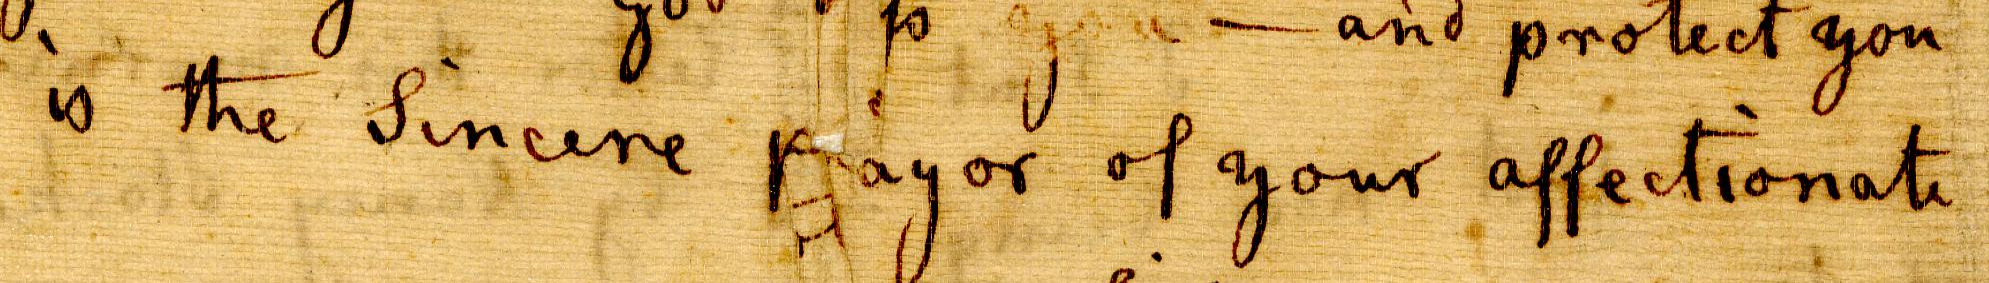is the Sincere p[_]ayor of your affectionate
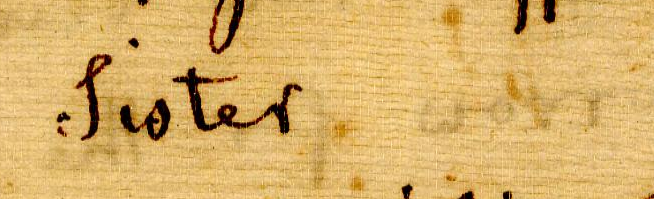Sister
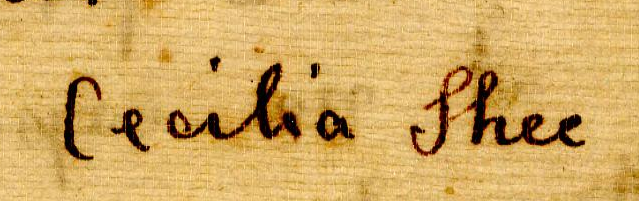Cecilia Shee
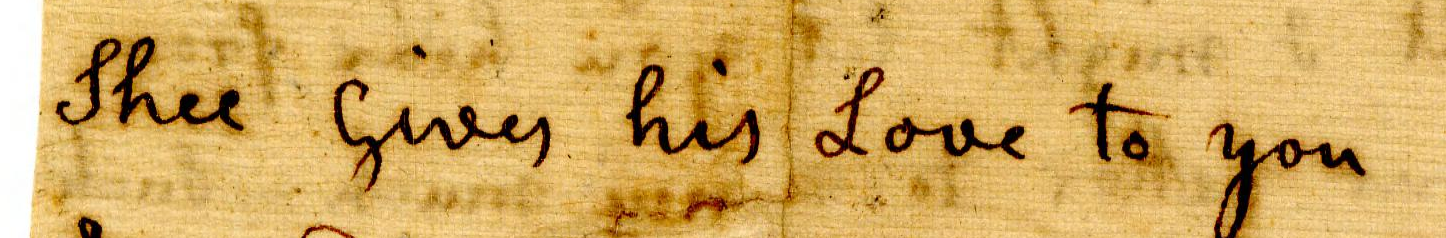Shee Gives his Love to you
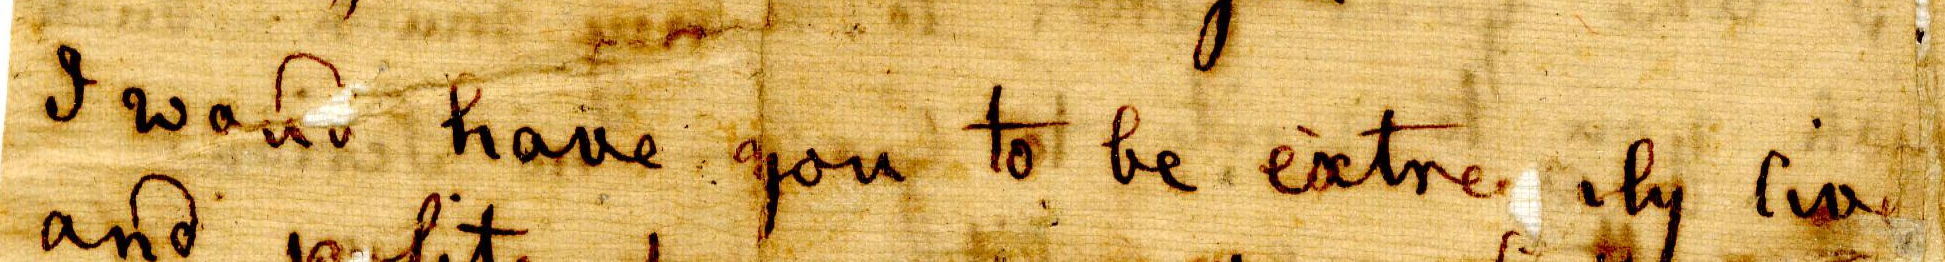i woud have you to be extre[_]ly Civ
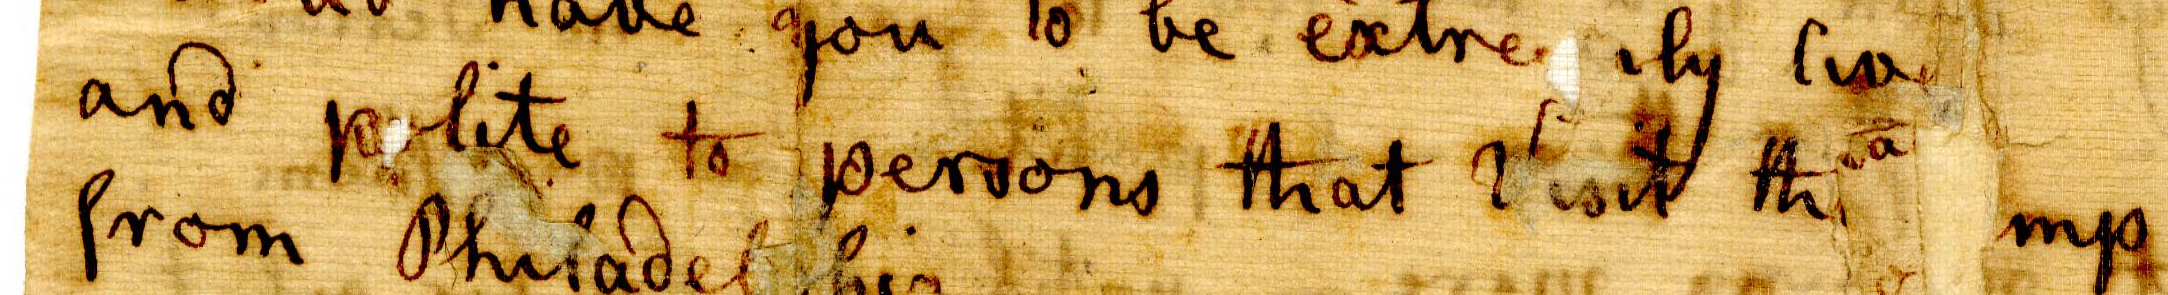and polite to persons that visit th[_] mp
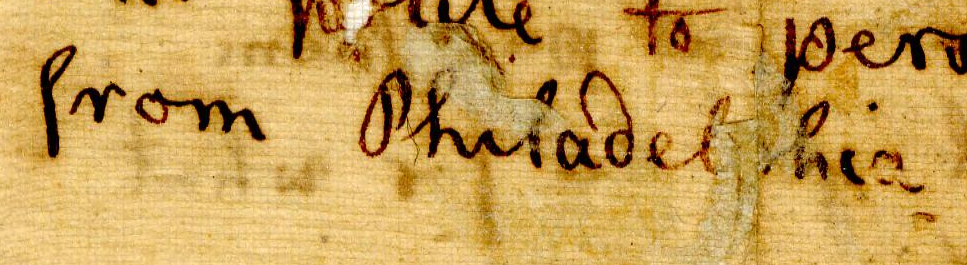from Philadelphia
